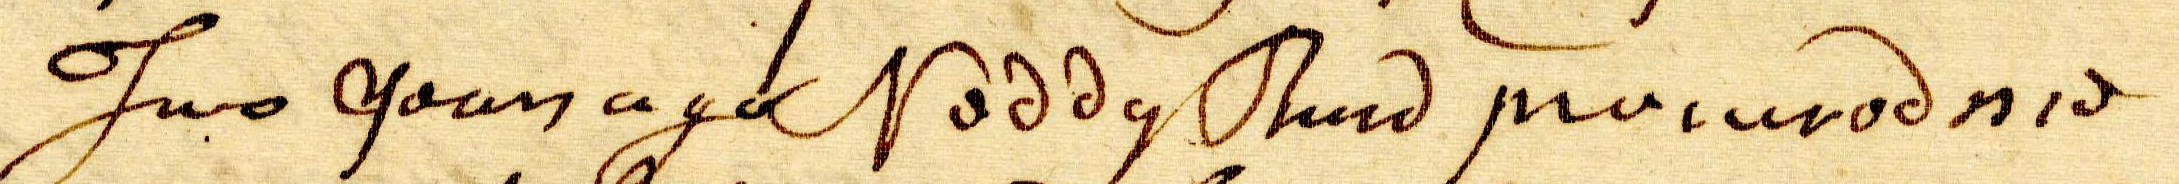Two Yours ago Neddy Burd procured me
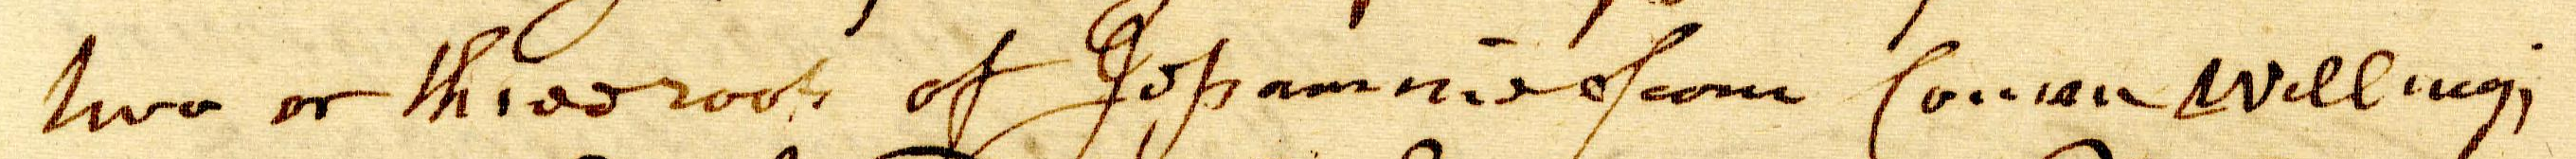two or three roots of Jasmine from Cousin Willing's
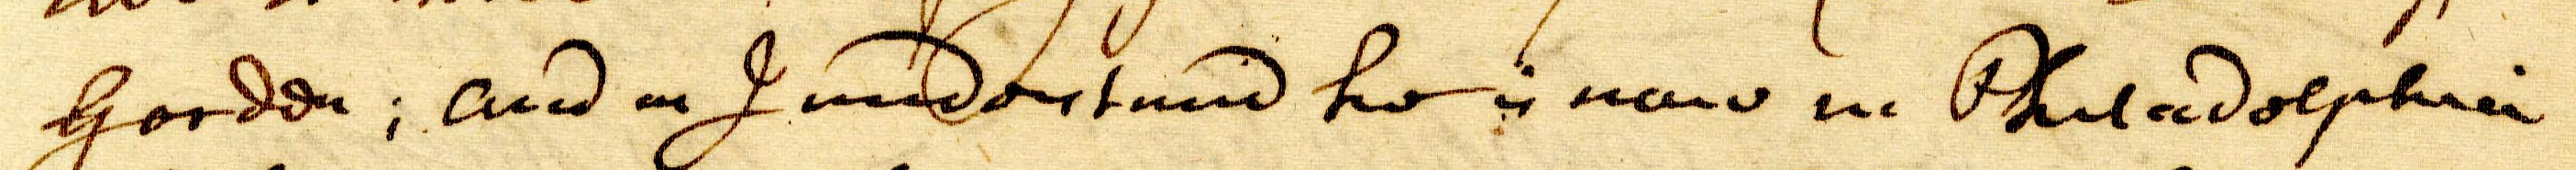Garden; And as I understand he is now in Philadelphia
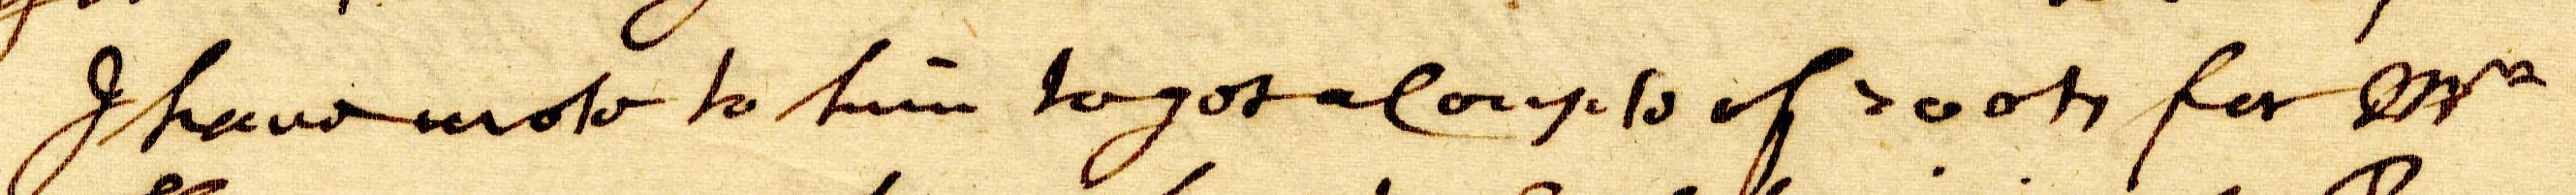I have wrote to him to get a Couple of roots for M^rs
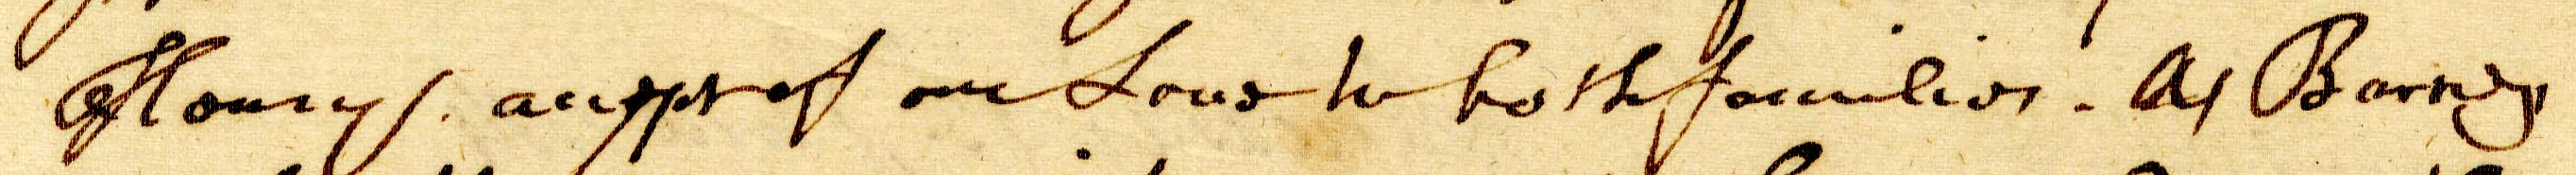Floury. accept of me Love to both families. As Barney
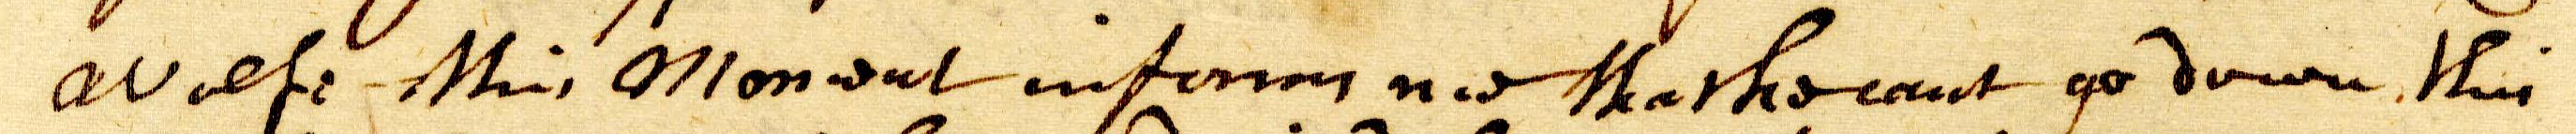Wolf this Monday informs me that he cant go down this
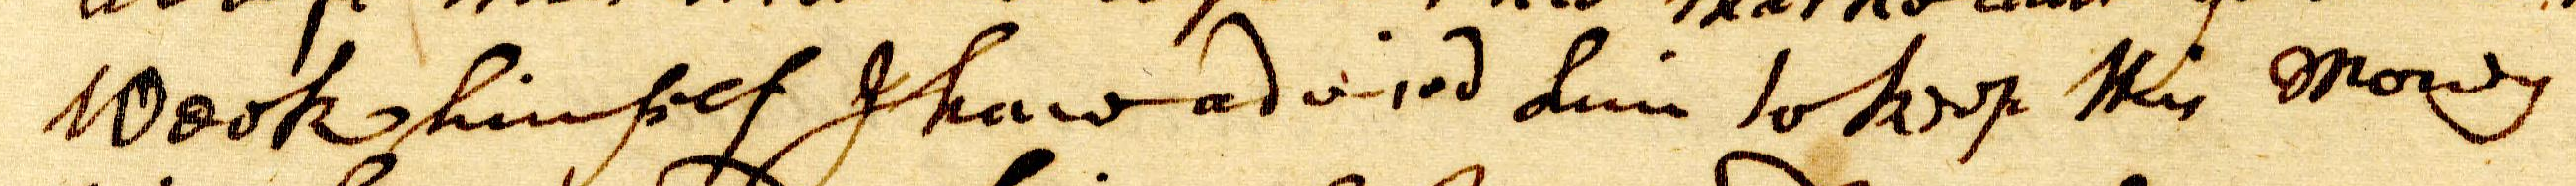Work himself I have advised him to keep this Money
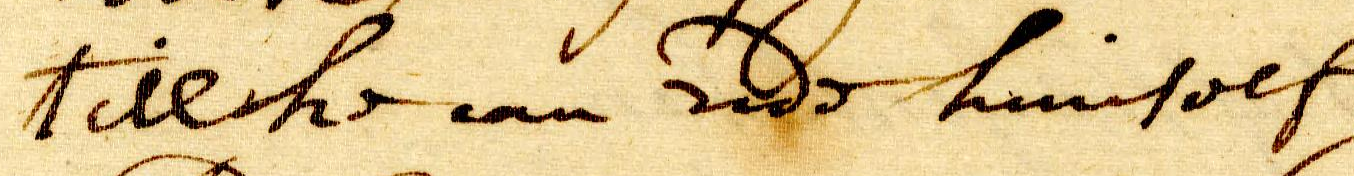till he can ride himself
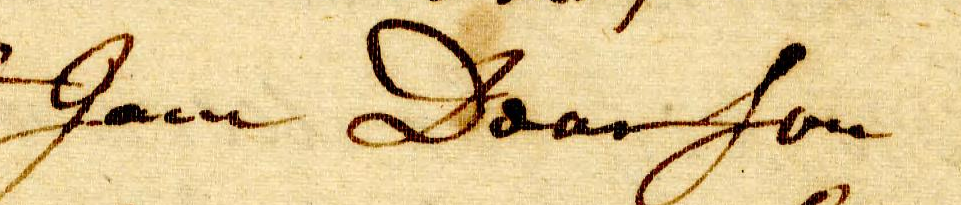I am Dear Son
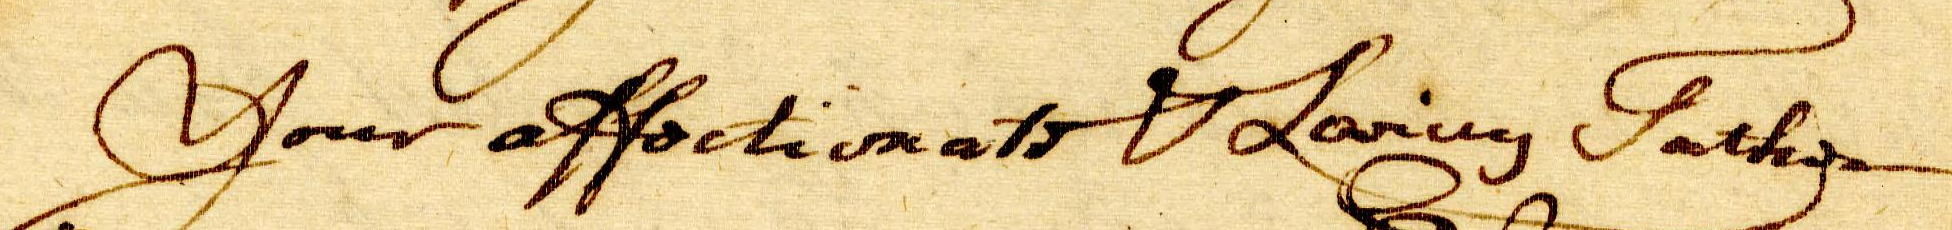Your affectionate & Loving Father
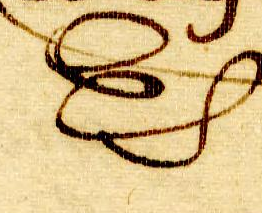ES
